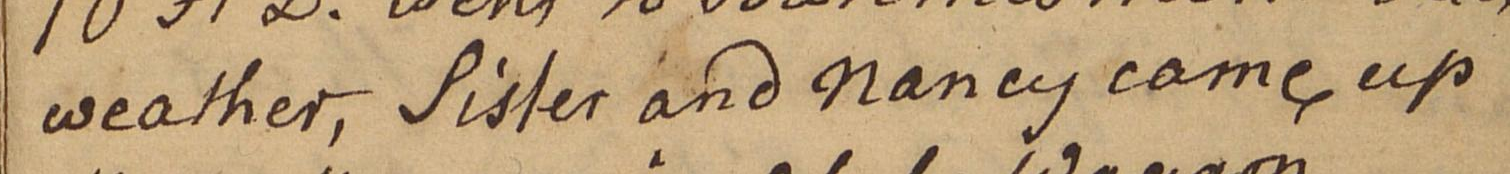weather, Sister and Nancy came up
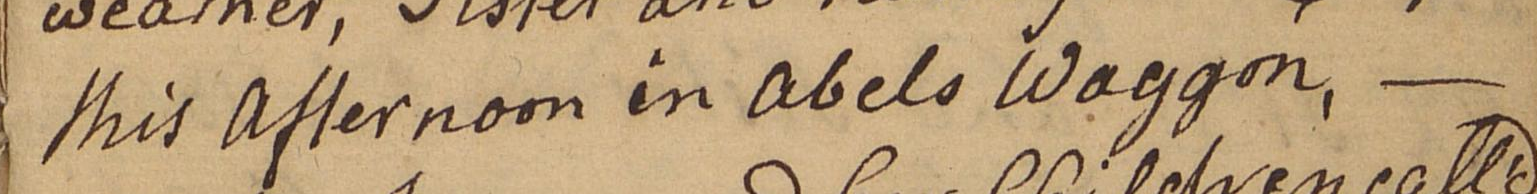this Afternoon in Abels Waggon,-
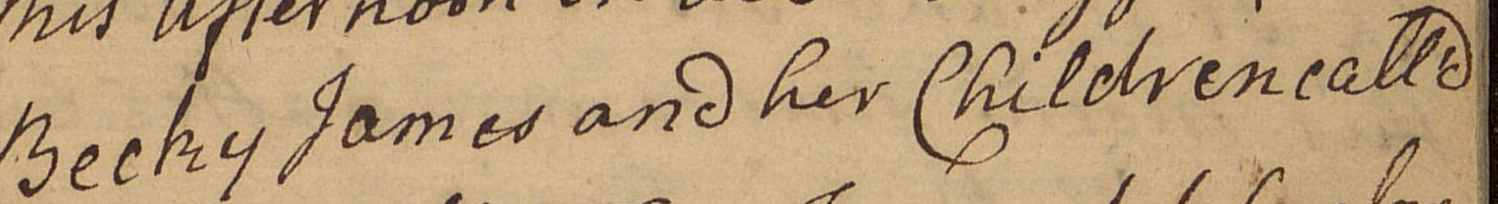Becky James and her Children call'd
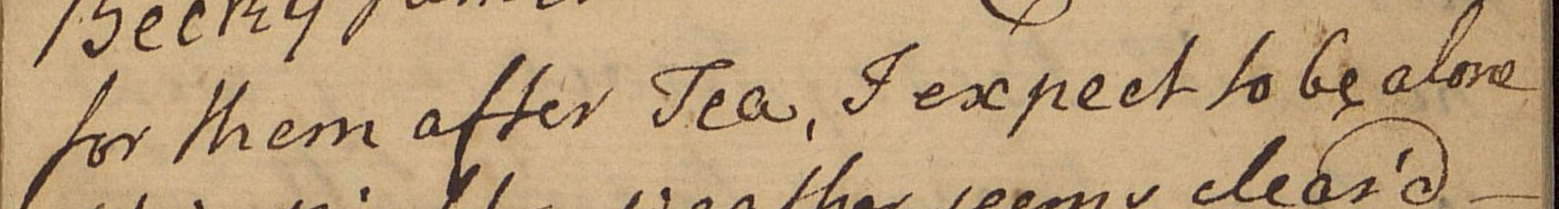for them after Tea, I expect to be alone
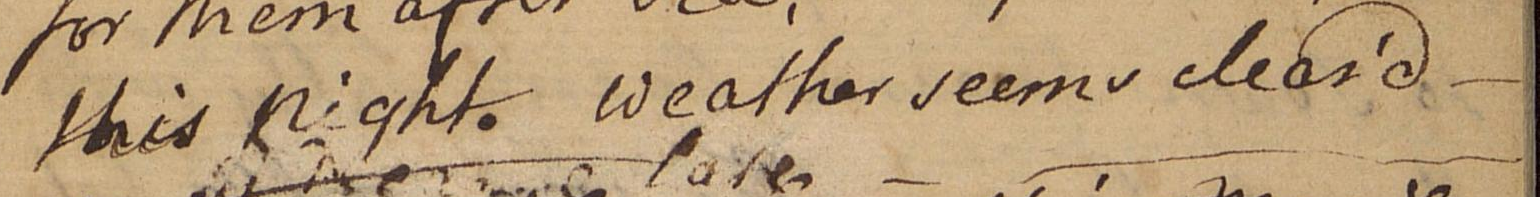this night. Weather seems clear'd-
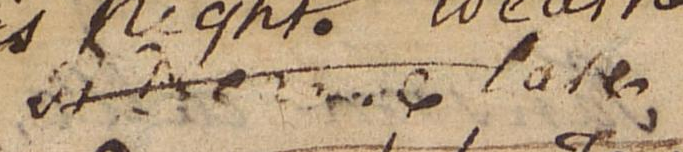[HD came late]
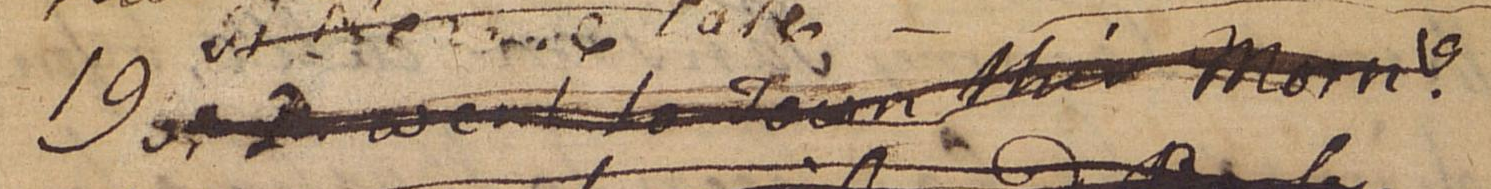19 [HD went to Town this] Morn^g.
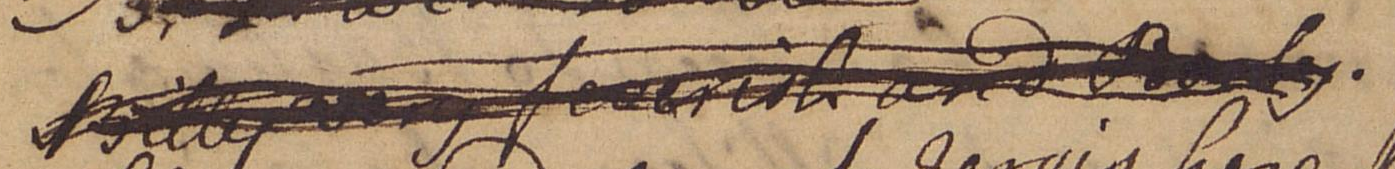[Billy very feverish and Poorly.]
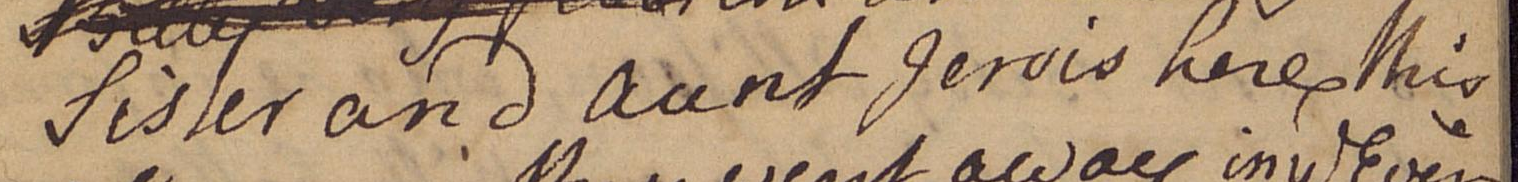Sister and Aunt Jervis here this
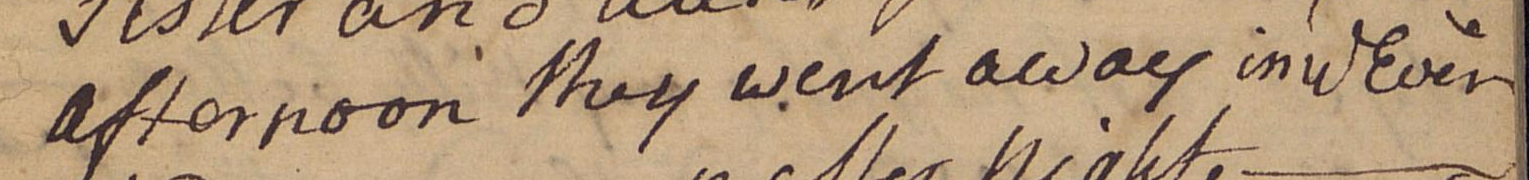Afternoon they went away in y^e Even^g
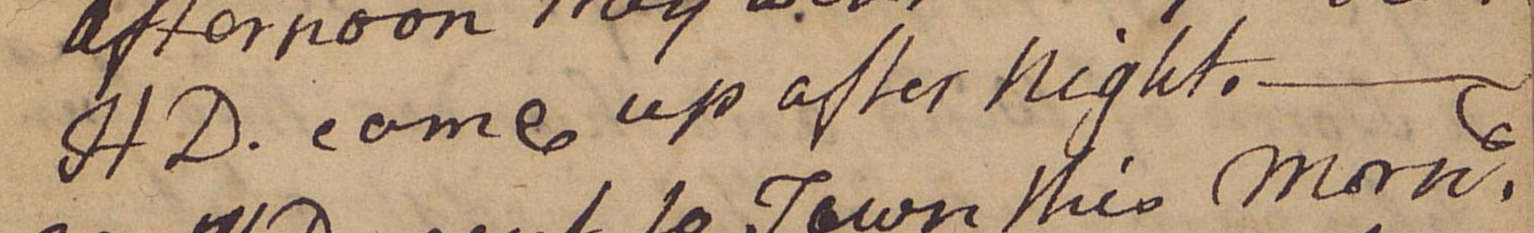HD. came up after Night.-
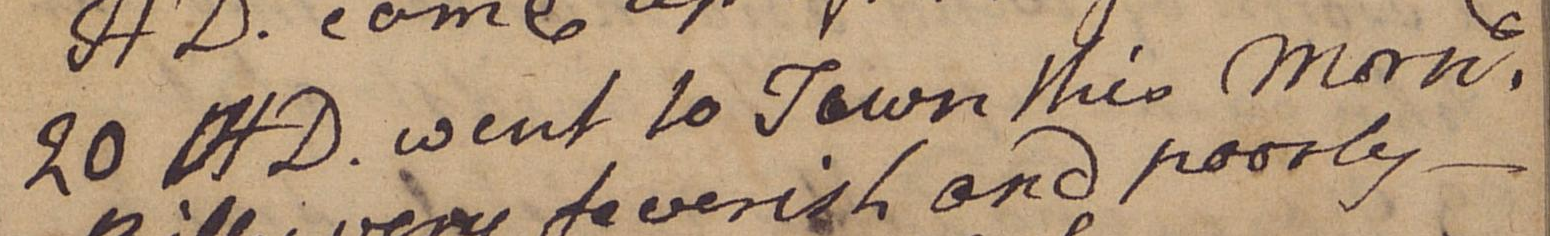20 HD. went to Town this Morn^g
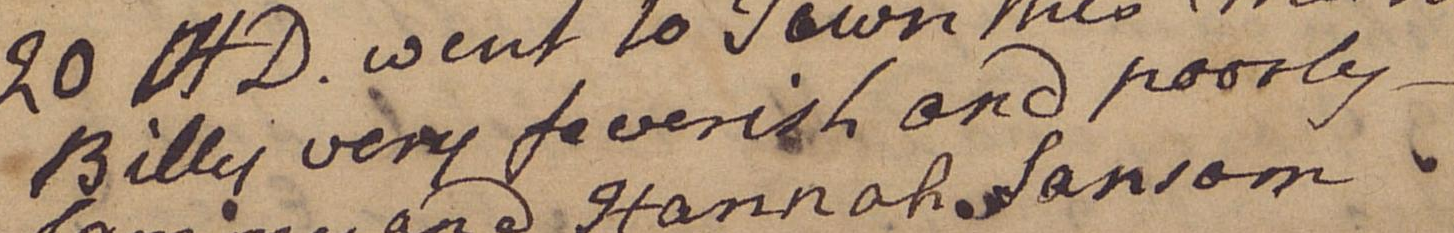Billy very feverish and poorly -
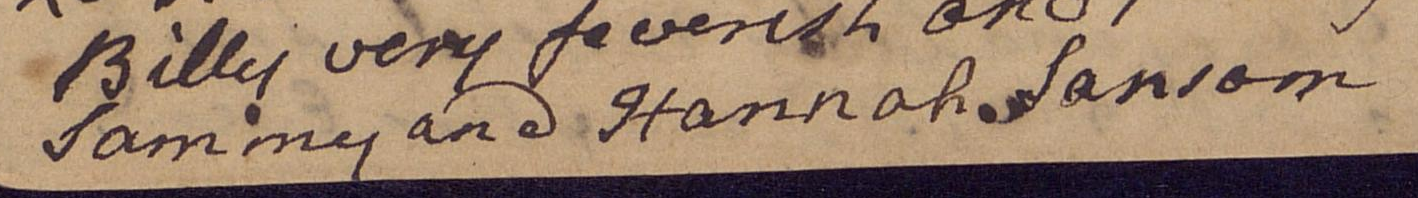Sammy, and Hannah Sansom
